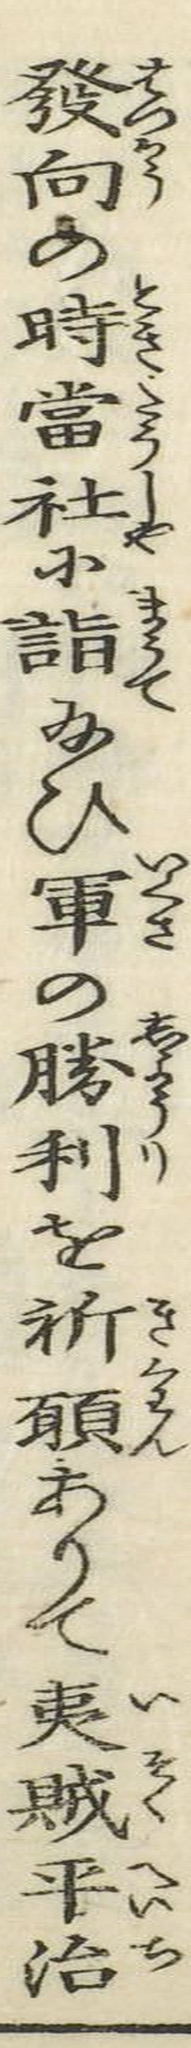発向の時当社に詣給ひ軍の勝利を祈願ありて夷賊平治
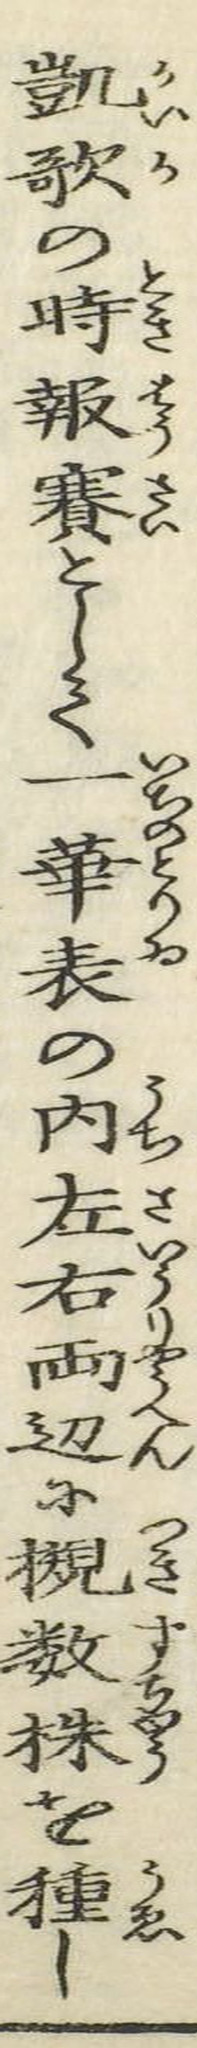凱歌の時報賽として一華表の内左右両辺に槻数株を種し
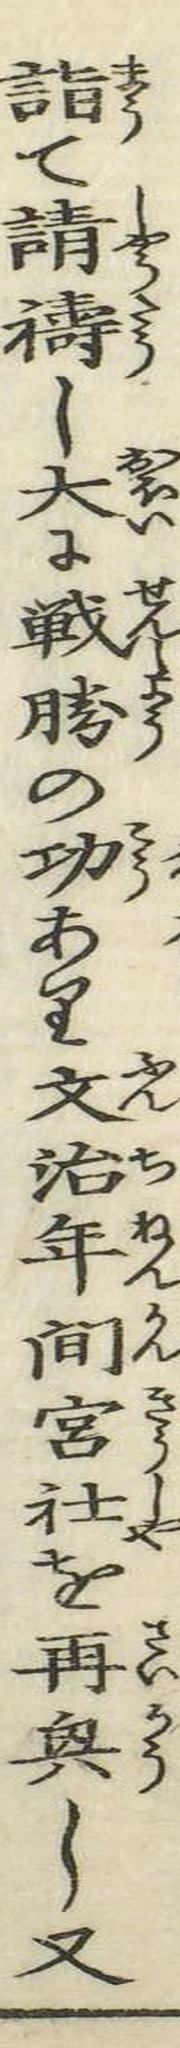詣て請祷し大に戦勝の功あり文治年間宮社を再興し又
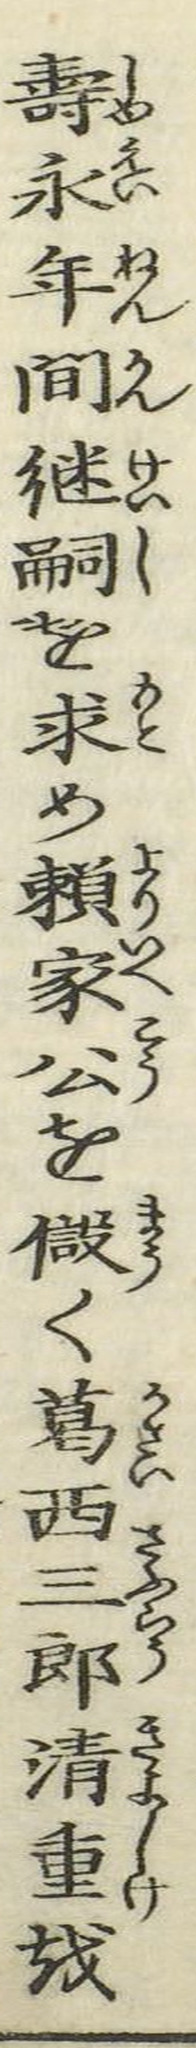寿永年間継嗣を求め頼家公をく葛西三郎清重を
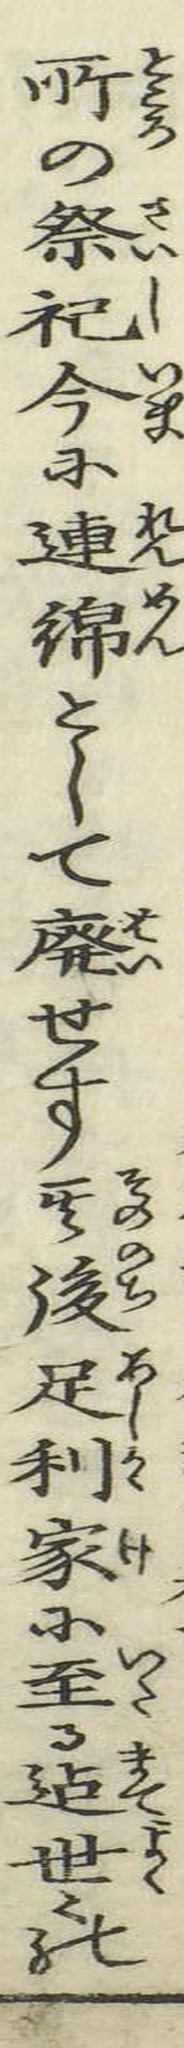所の祭祀今に連綿として廃せす其後足利家に至る迠世々の
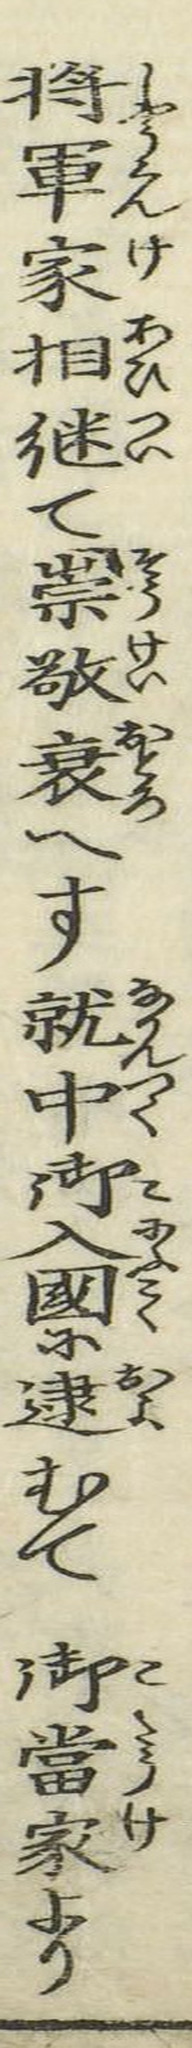将軍家相継て崇敬衰へす就中御入国に逮むて御当家より
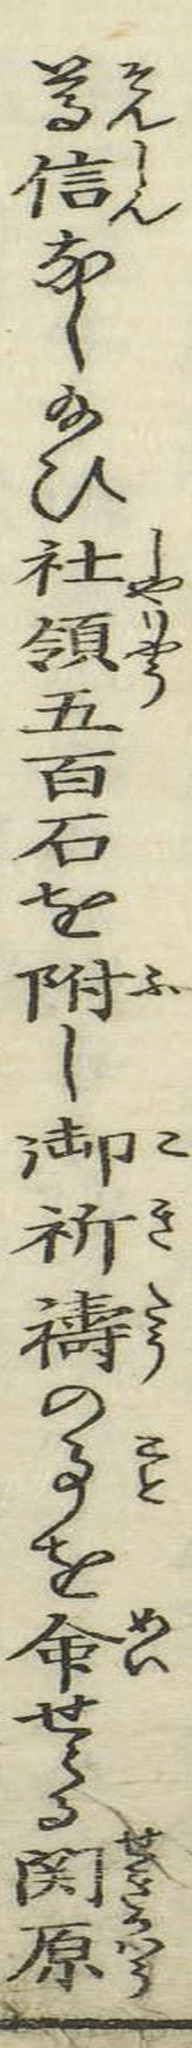尊信なし給ひ社領五百石を附し御祈祷の事を命せらる関原
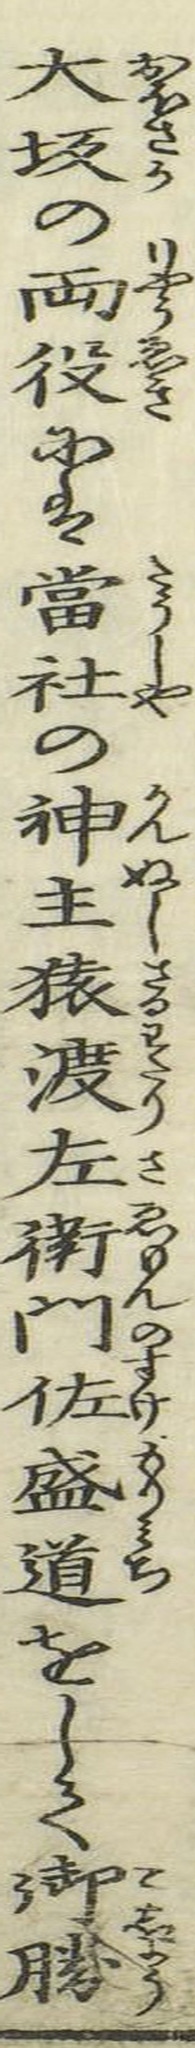大坂の両役には当社の神主猿渡左衛門佐盛道をして御勝
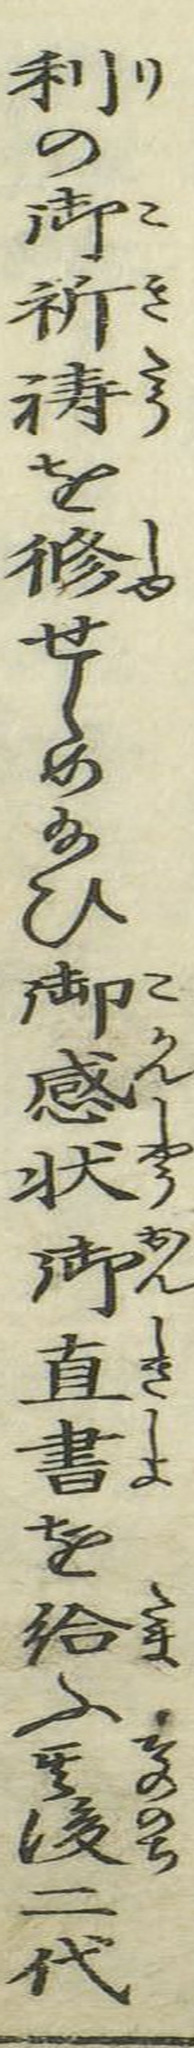利の御祈祷を修せしめ給ひ御感状御直書を給ふ其後二代

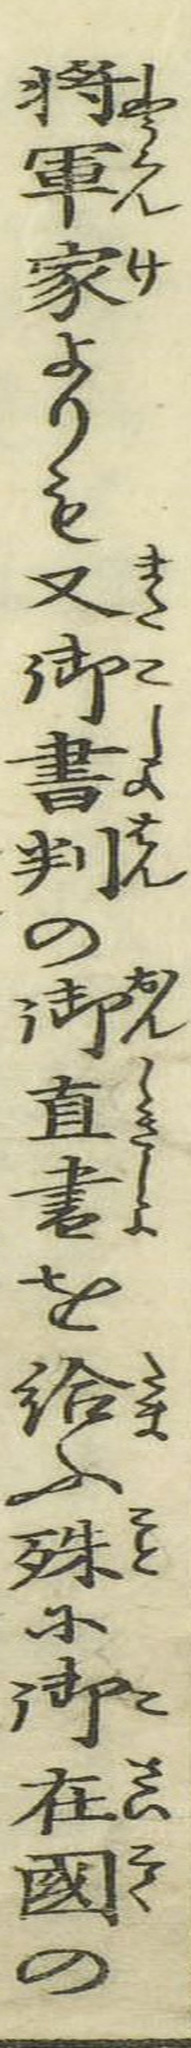将軍家よりも又御書判の御直書を給ふ殊に御在国の
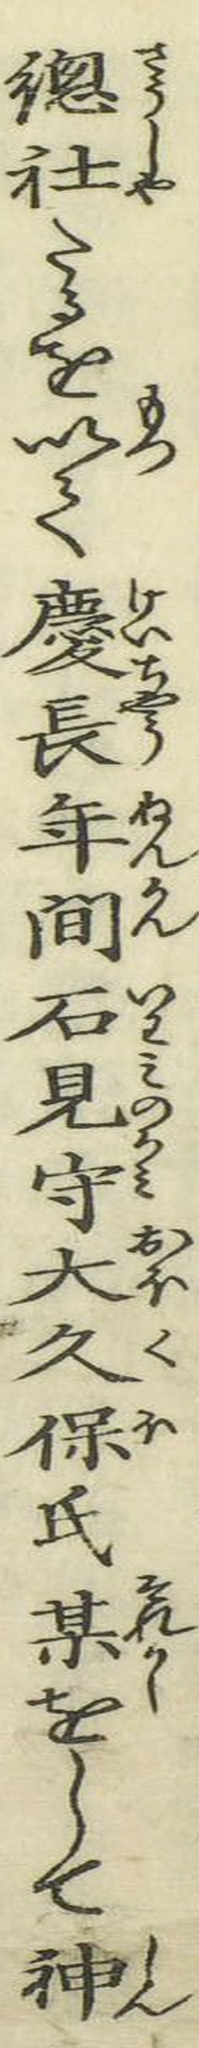総社たるを以て慶長年間石見守大久保氏某をして神
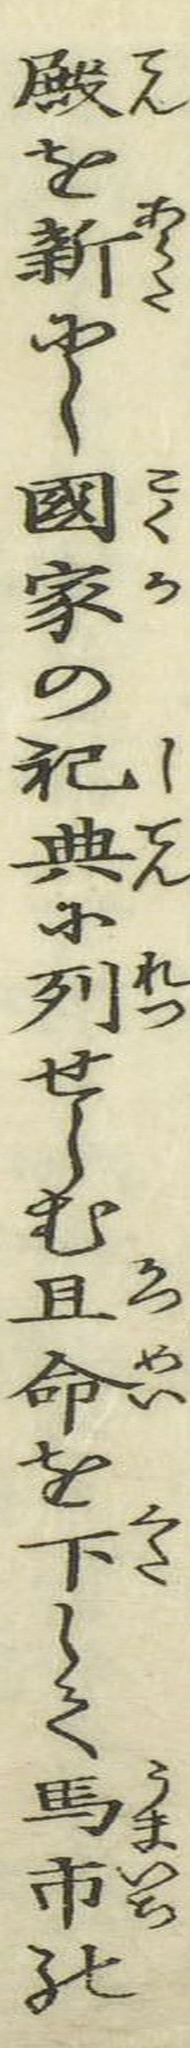殿を新にし国家の祀典に列せしむ且命を下して馬市の
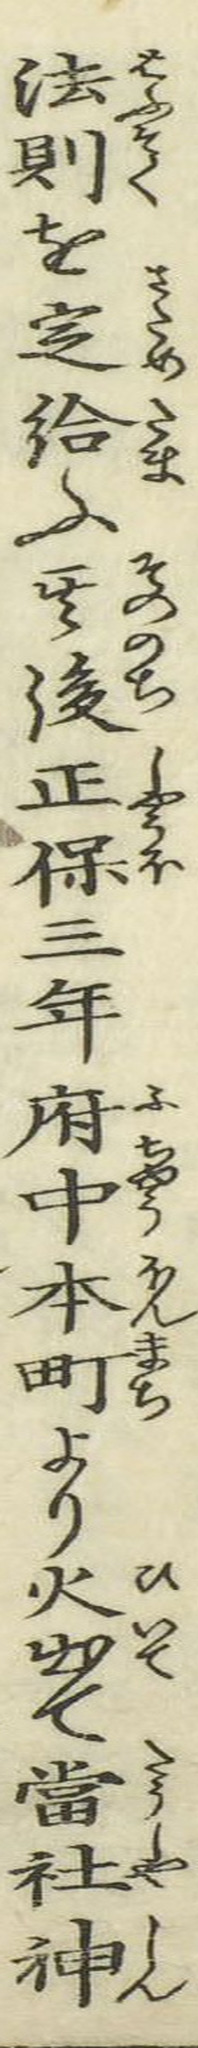法則を定給ふ其後正保三年府中本町より火出て当社神
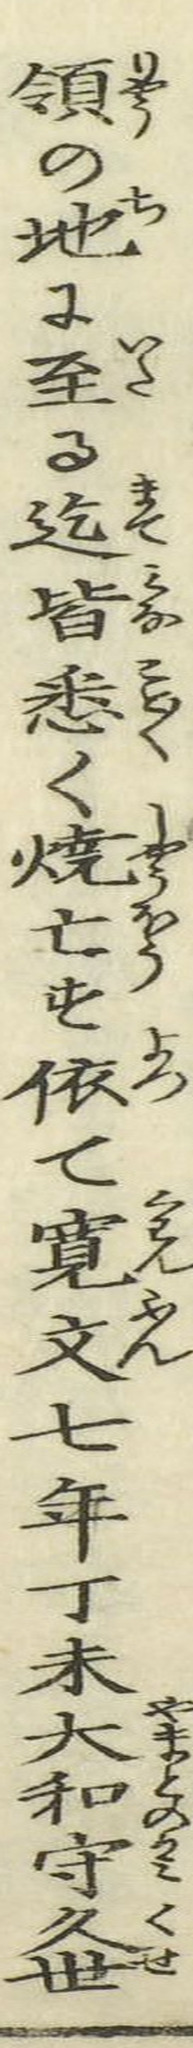領の地に至る迄皆悉く焼亡す依て寛文七年丁未大和守久世
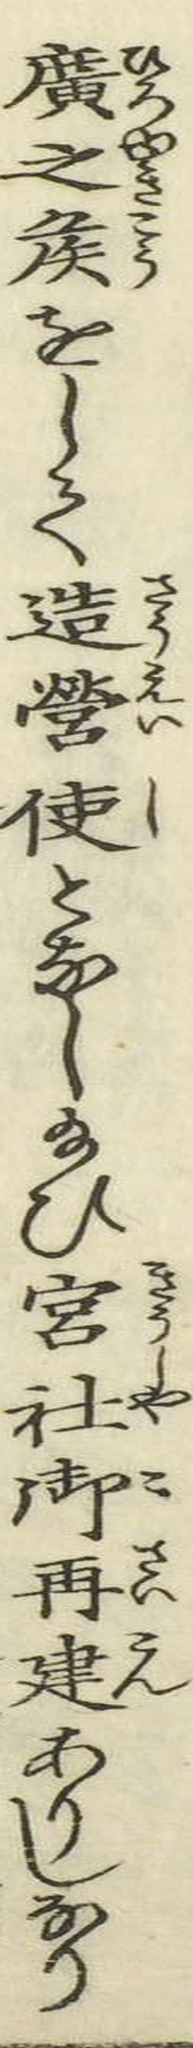広之候をして造営使となし給ひ宮社御再建ありしなり
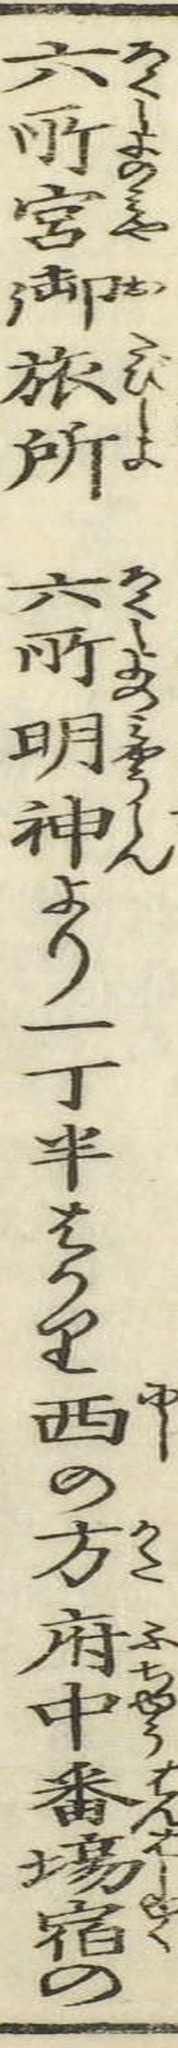六所宮御旅所六所明神より一丁半はかり西の方府中番場宿の
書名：江戸名所図会 20巻 巻之10
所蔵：東京学芸大学教育コンテンツアーカイブ
